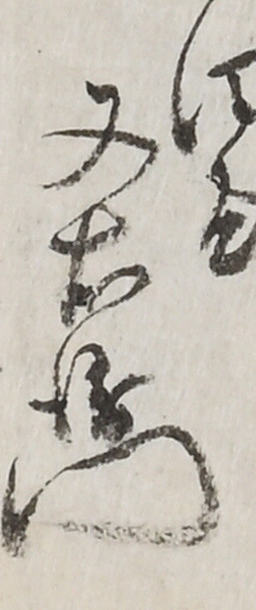又右衛門
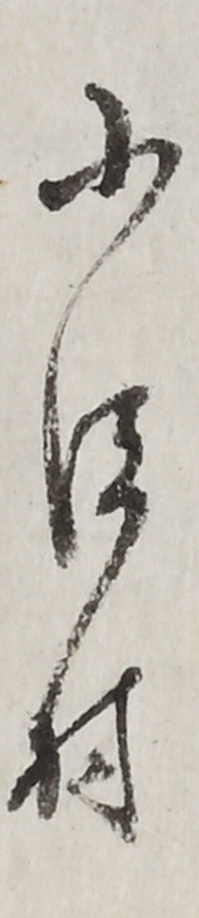小沢村

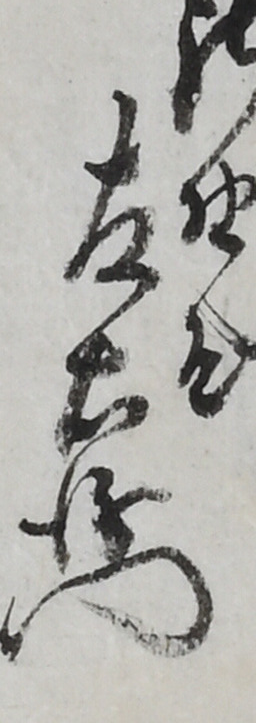友右衛門
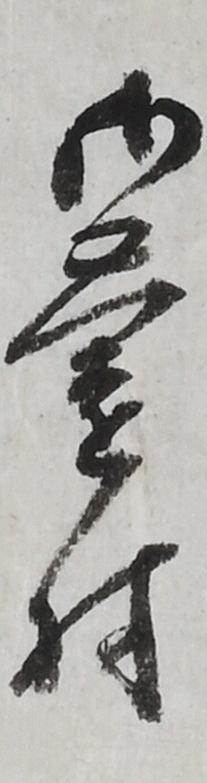御園村
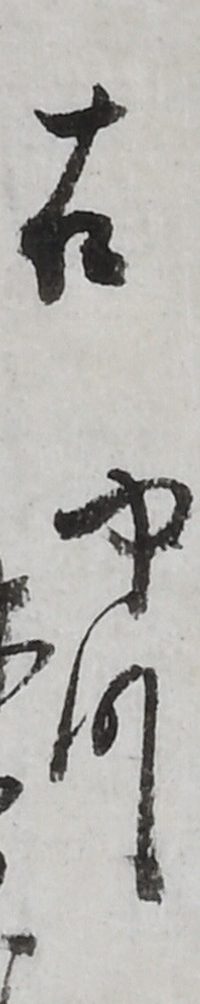右中町
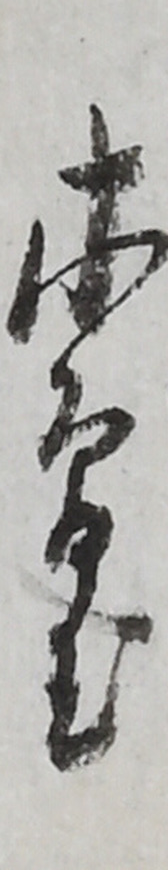木曽屋
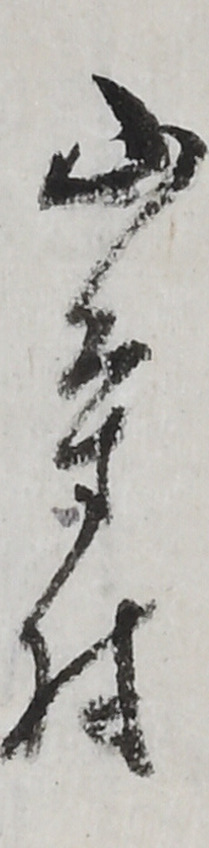山寺村
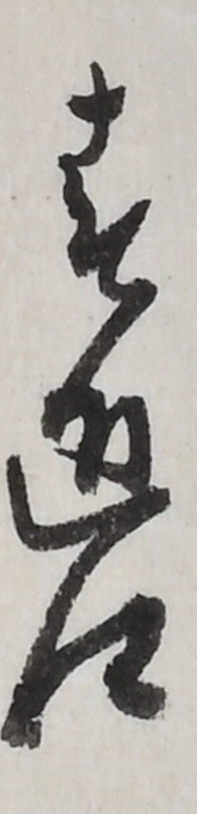春近郷
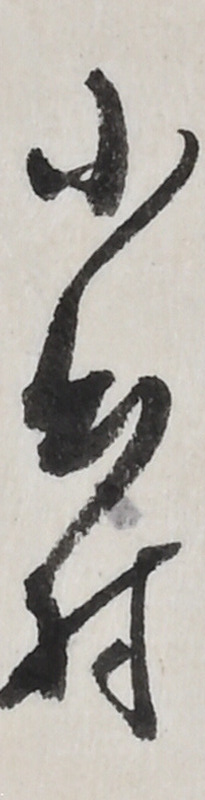小出村
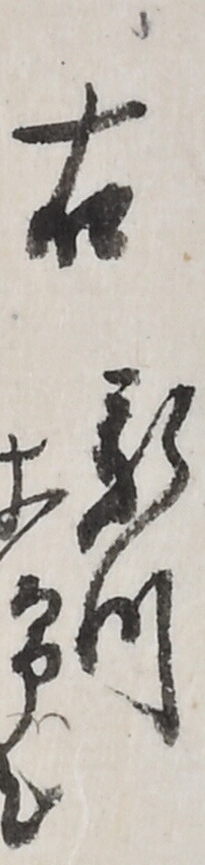右新町
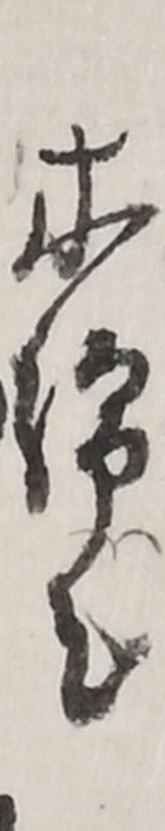木綿屋
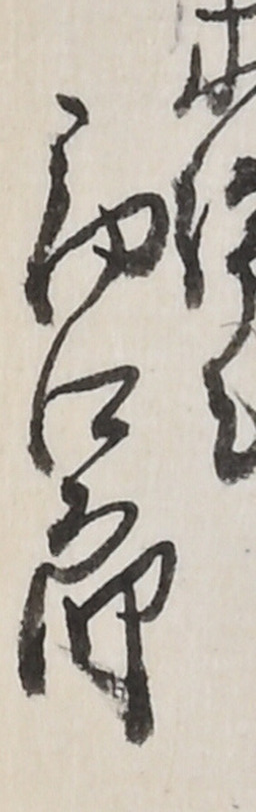初四郎
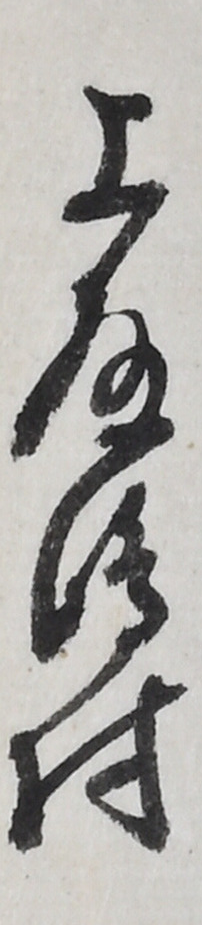上殿嶋村
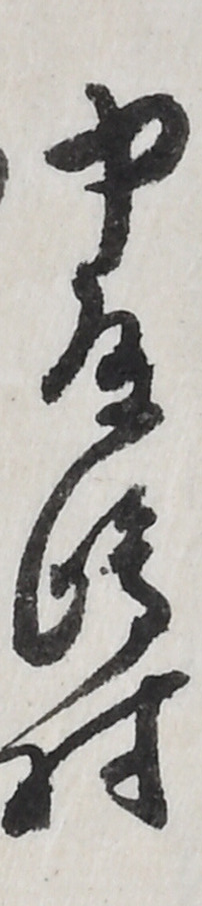中殿嶋村
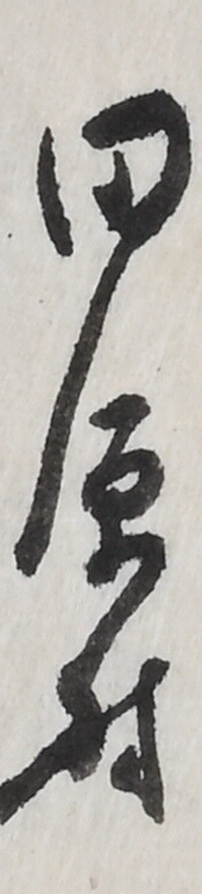田原村
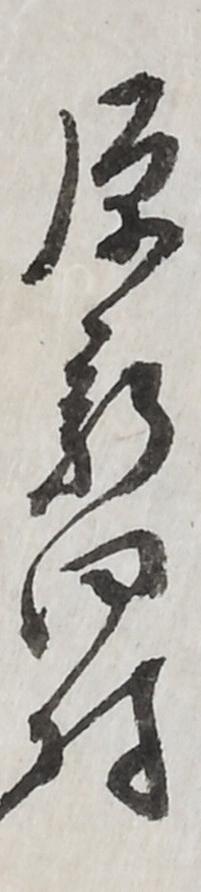原新田村
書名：年内行事帳
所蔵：伊那市立高遠町図書館・合同会社AMANE
